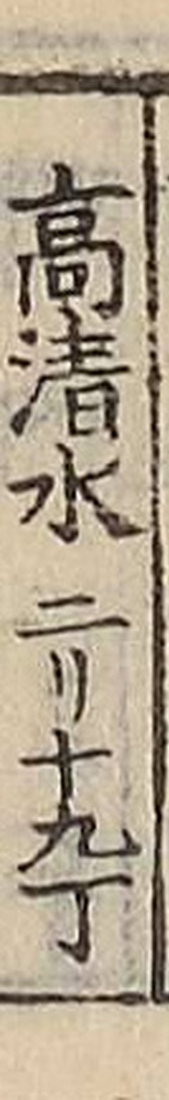高清水二リ十九丁
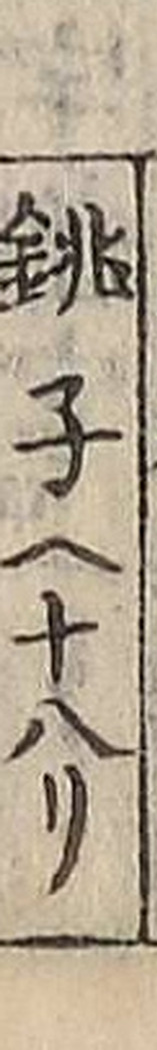銚子へ十八リ
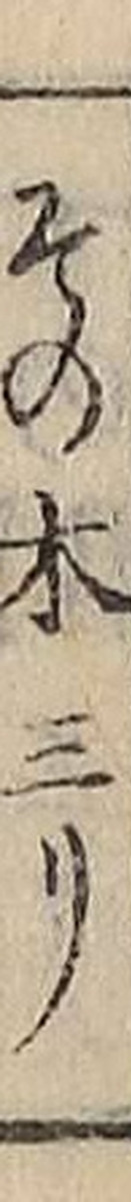その木三リ
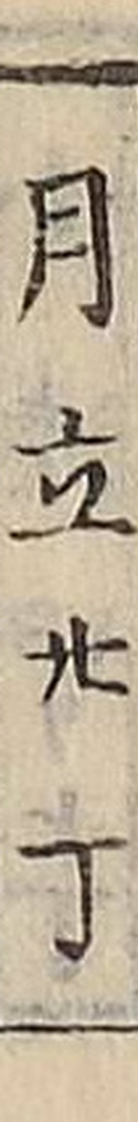月立廿丁
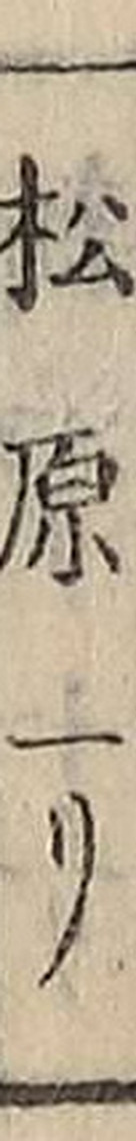松原一リ
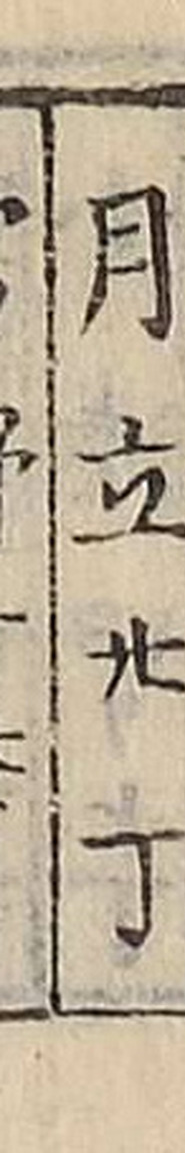月立廿丁
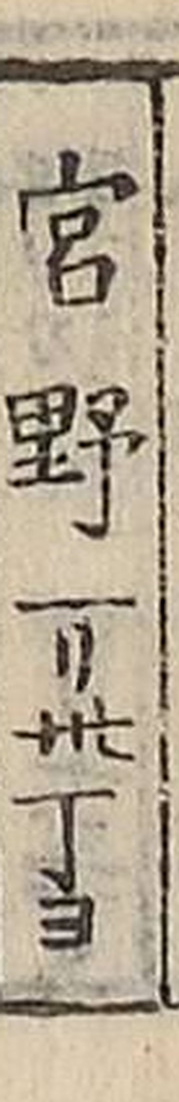宮野一リ卅丁ヨ
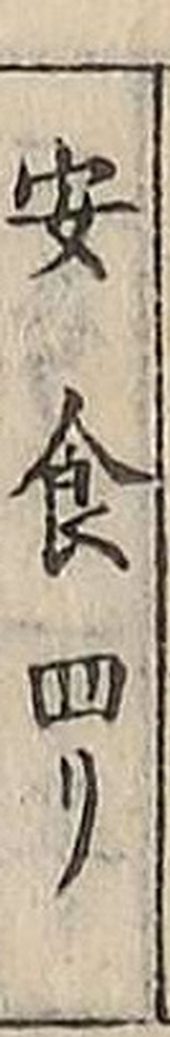安食四リ
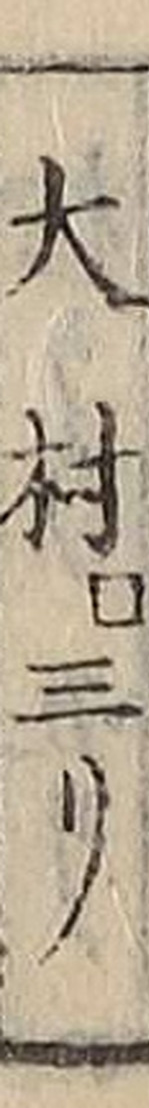大村▫三リ
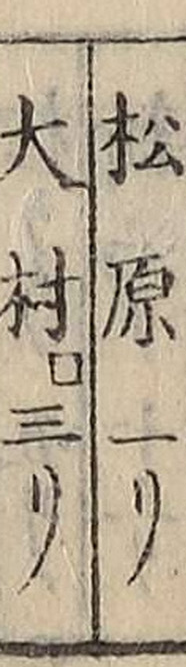大村▫三リ
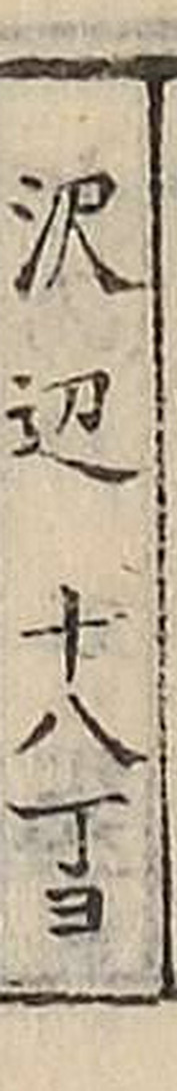沢辺十八丁ヨ
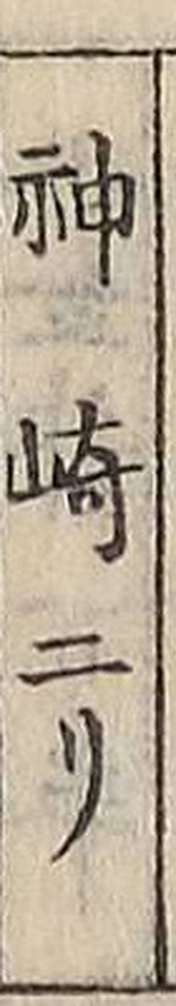神崎二リ
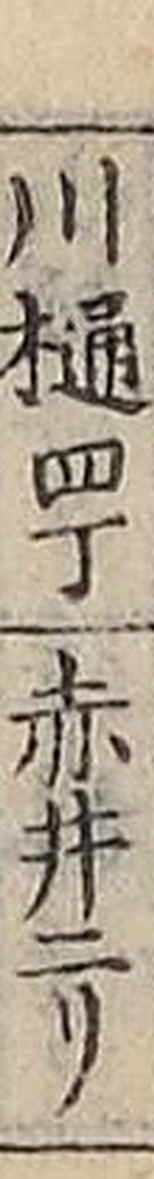川樋四丁赤井二リ
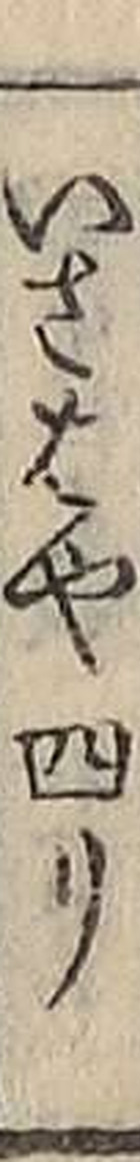いさはや四リ
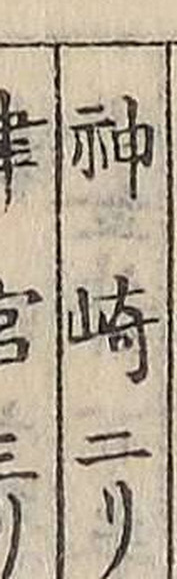神崎二リ
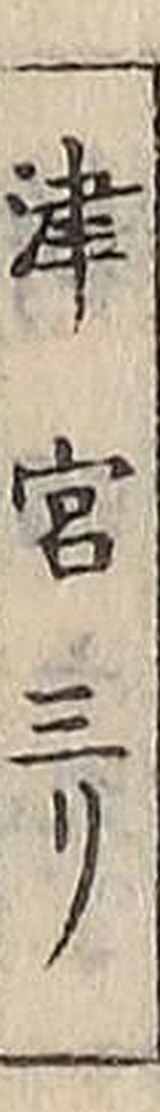津宮三リ
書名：旅行用心集
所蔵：神戸大学附属図書館 国文学研究資料館
